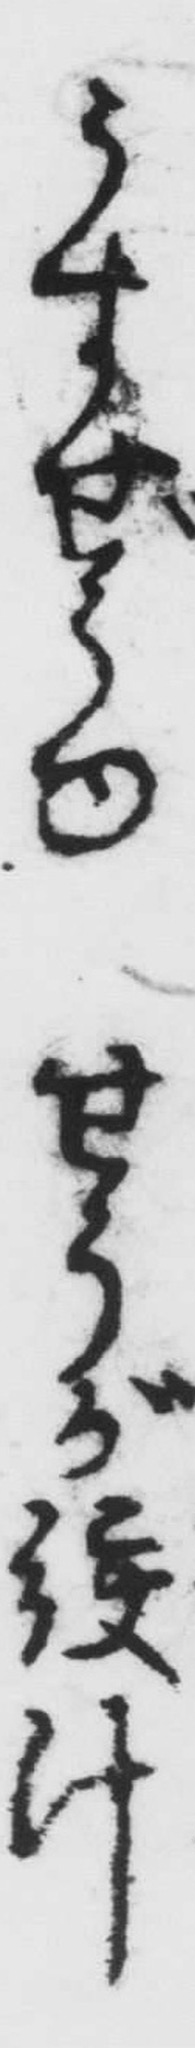うすぜうゆせうが絞汁
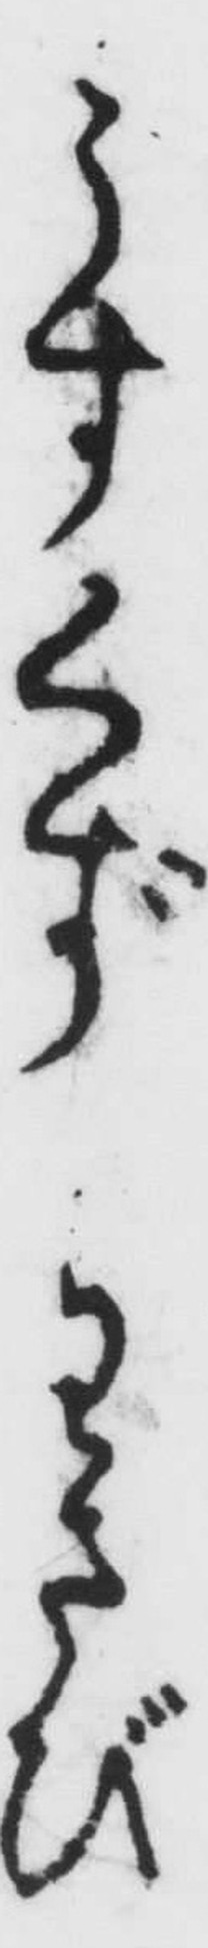うすくずわさび
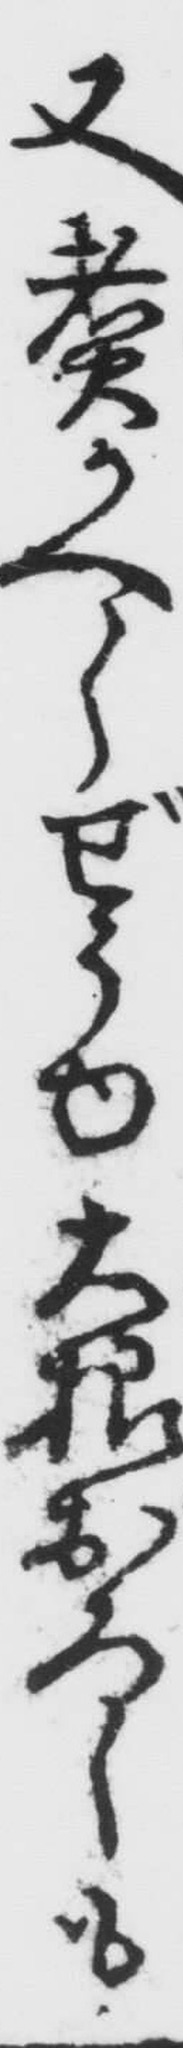又煮かへしぜうゆ大根おろしも
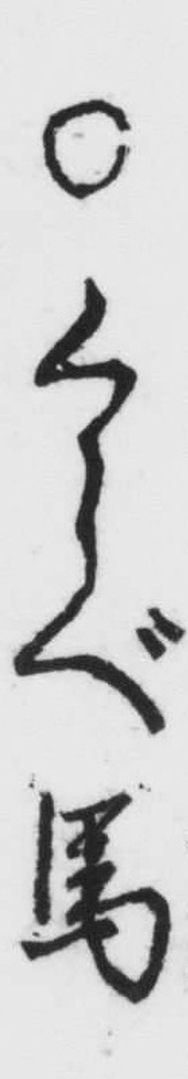○くらべ馬
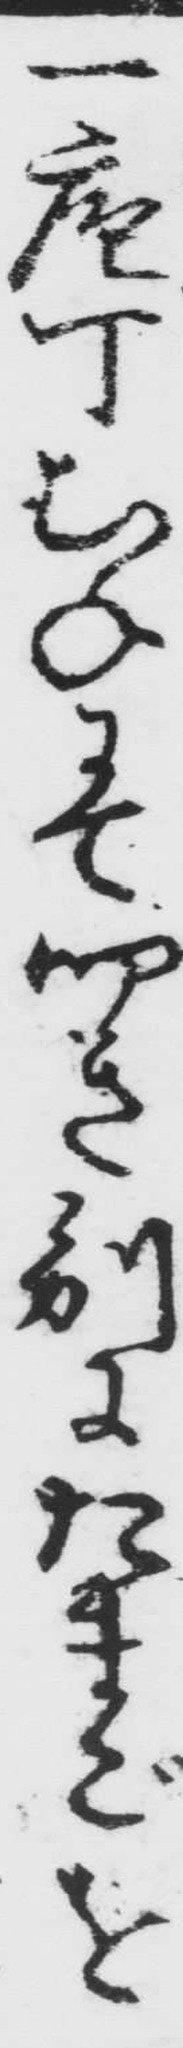一庖丁むねにて叩き別にたまごを
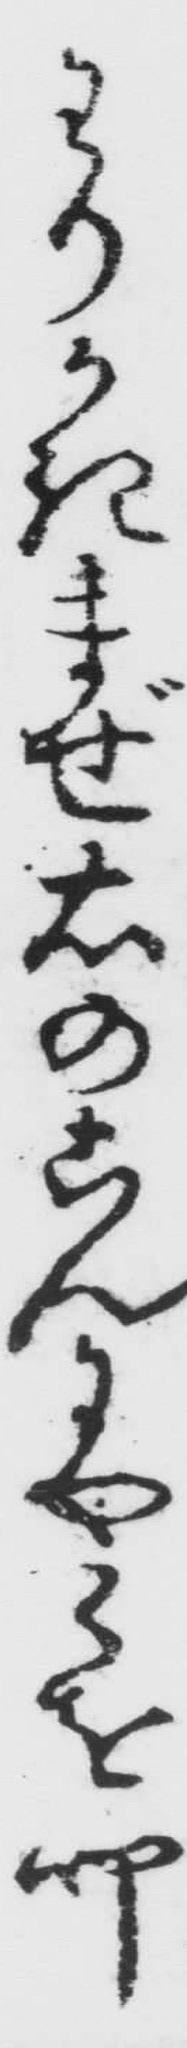わりかきまぜ右のこんにやくを叩
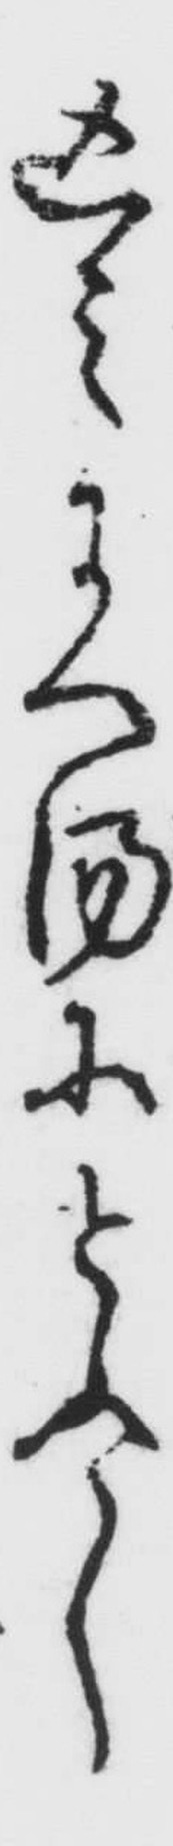込みにへ湯にとふし
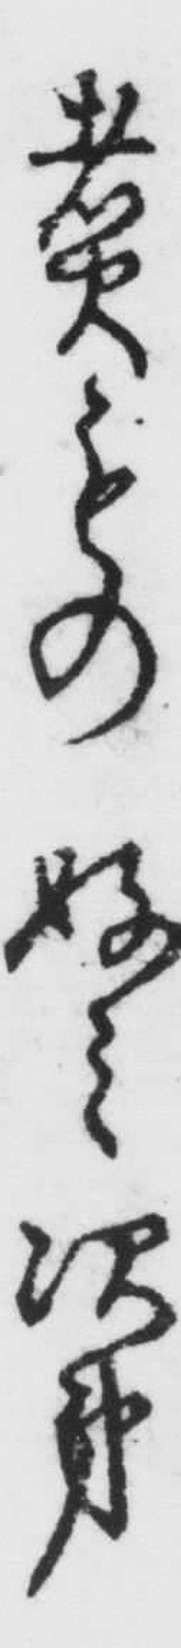煮もの好み次第

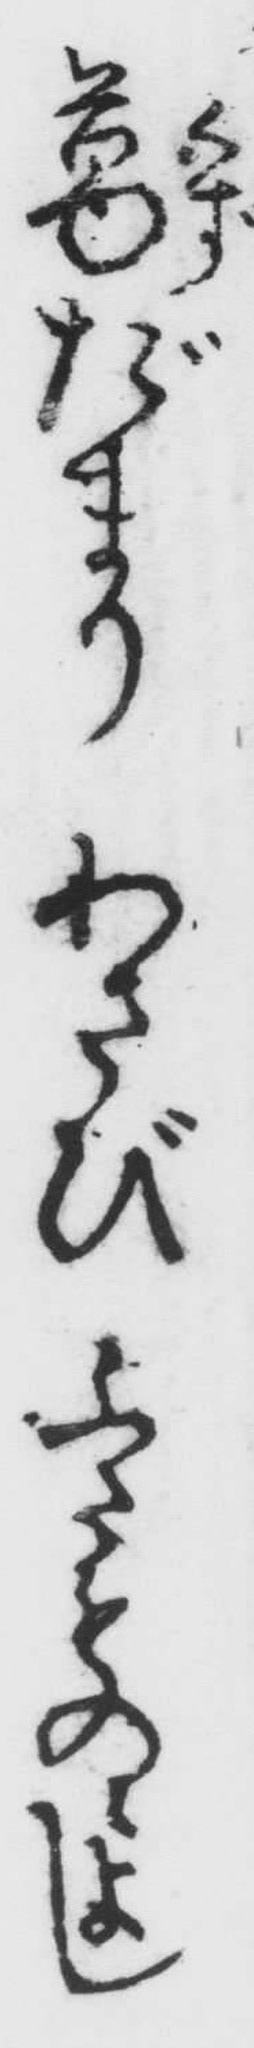葛だまりわさびふたものによし
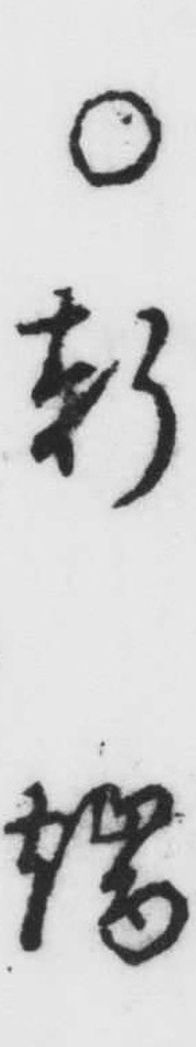○軒端
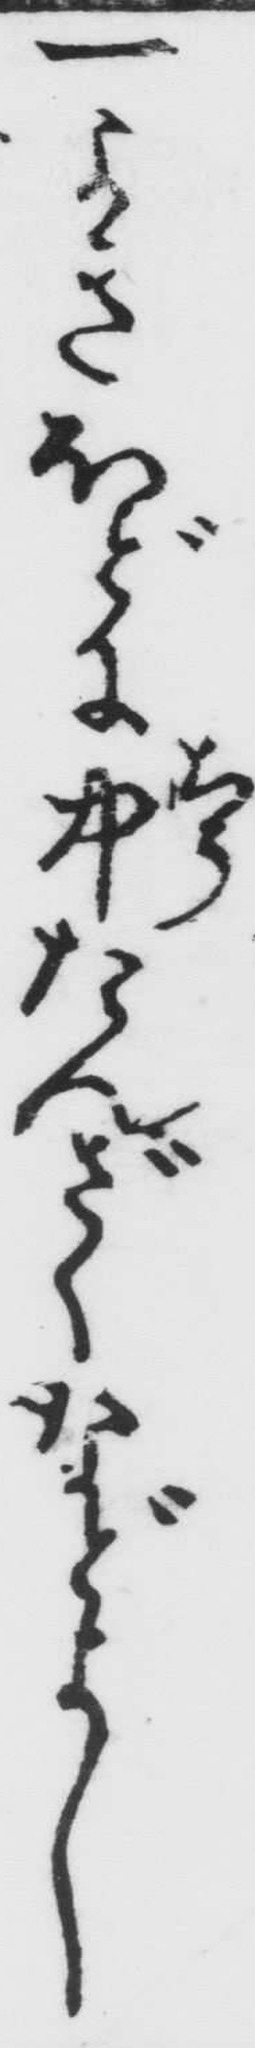一よきほどに中たんざくなどよし
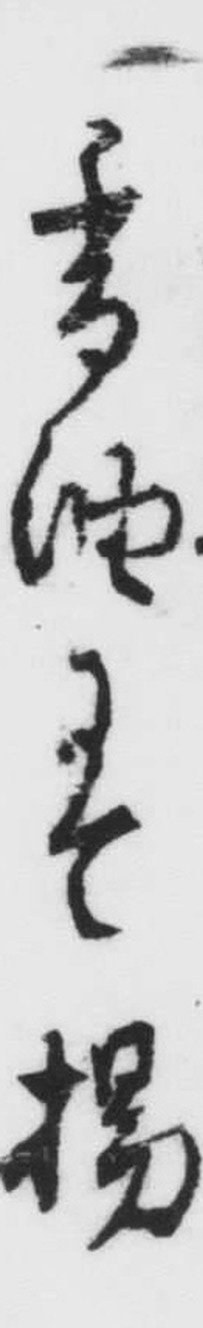香油にて揚
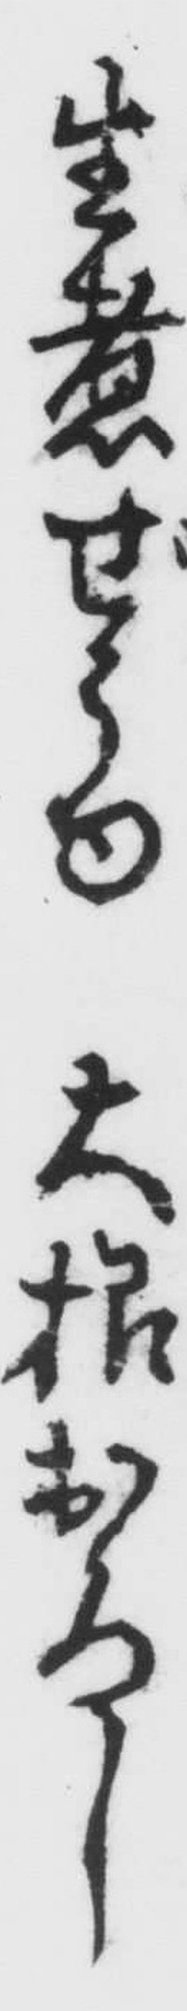生煮ぜうゆ大根おろし
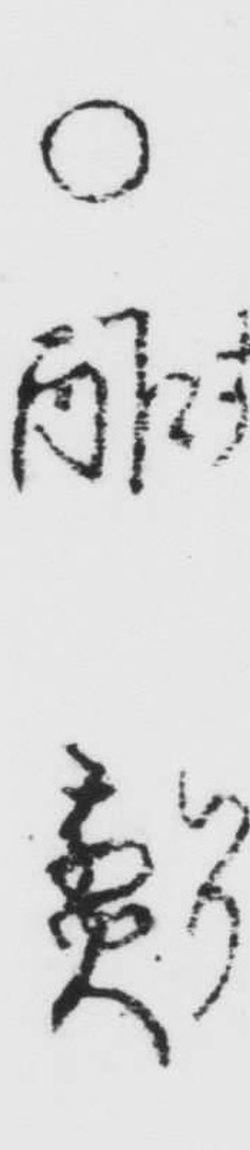○酢煎
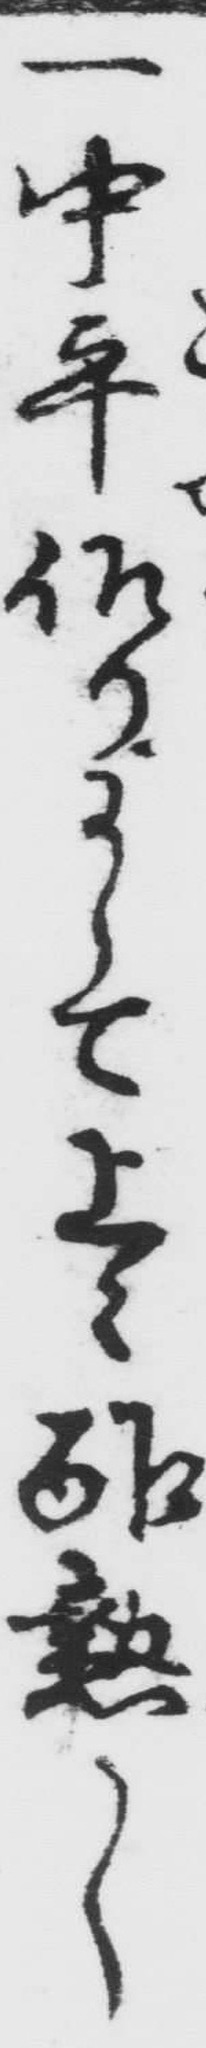一中平作りにして上々酢熱し
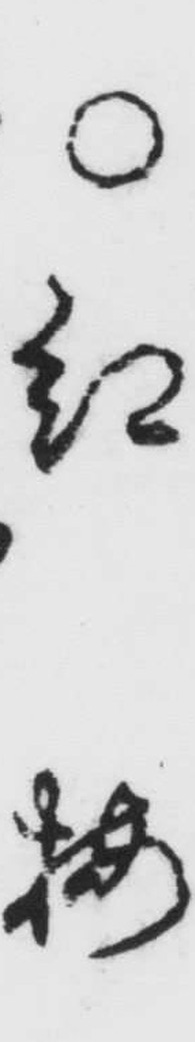○紅梅
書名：蒟蒻百珍
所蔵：大阪府立大学学術情報センター 国文学研究資料館
